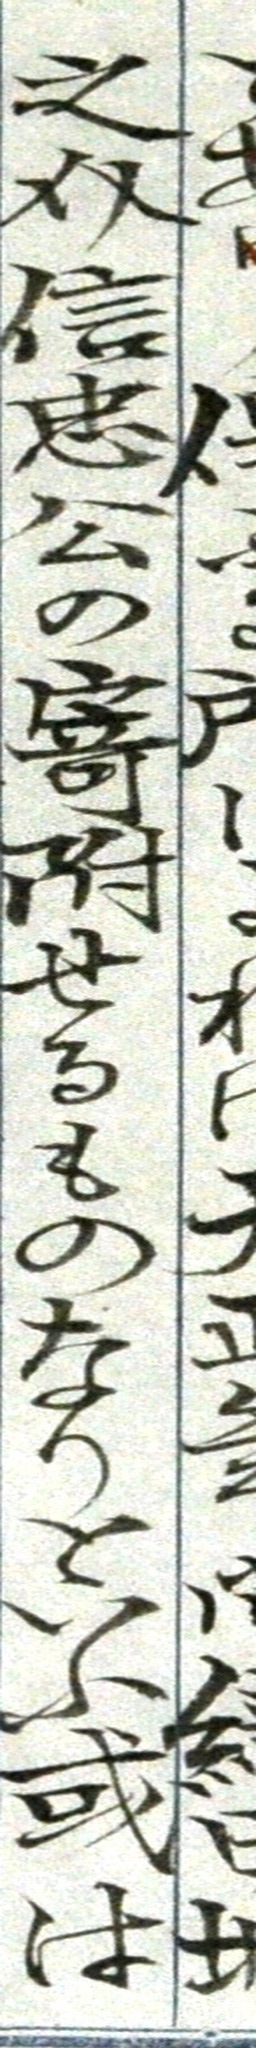之介信忠公の寄附せるものなりといふ或は
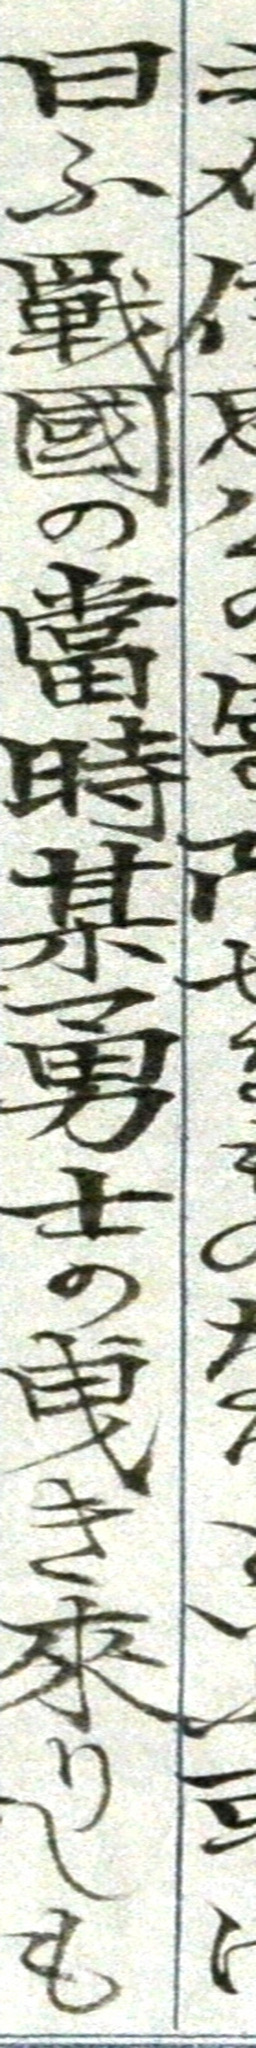曰ふ戦国の当時某勇士の曳き来りしも
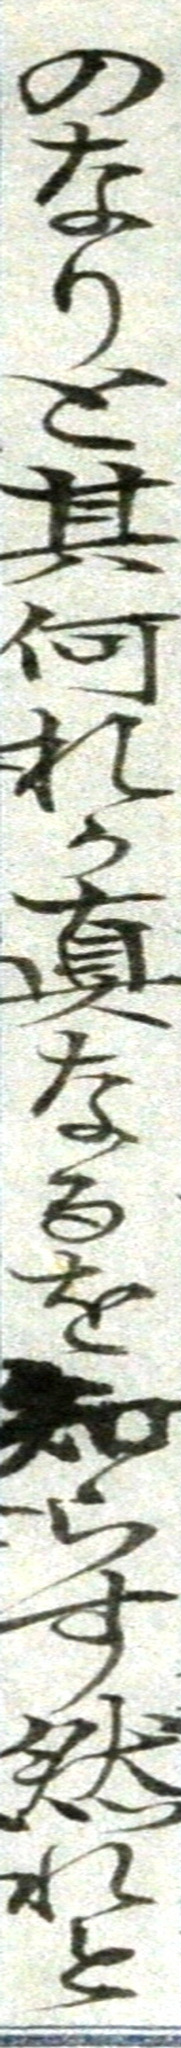のなりと其何れか真なるを知らす然れと
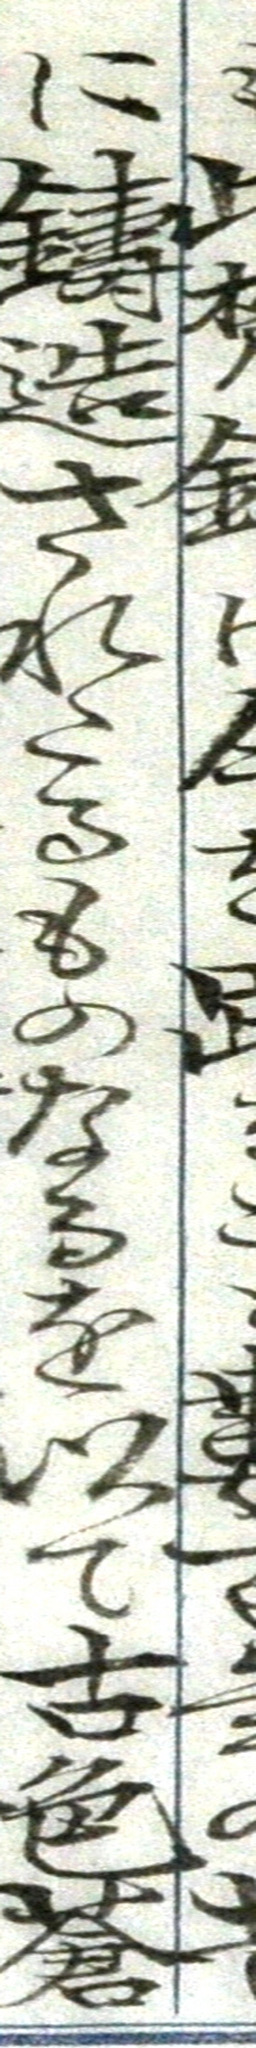に鋳造されたるものなるを以て古色蒼
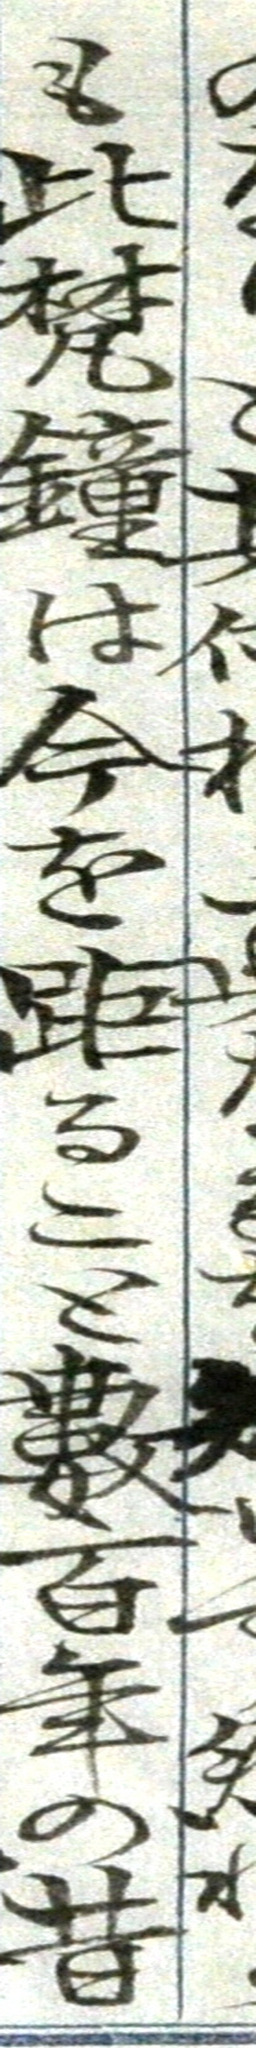も此梵鐘は今を距ること数百年の昔
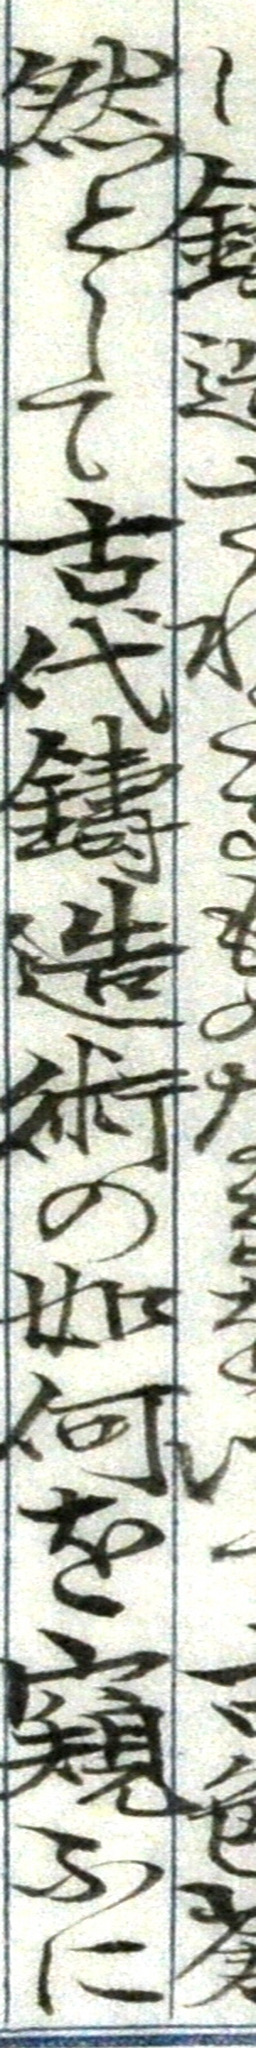然として古代鋳造術の如何を窺ふに
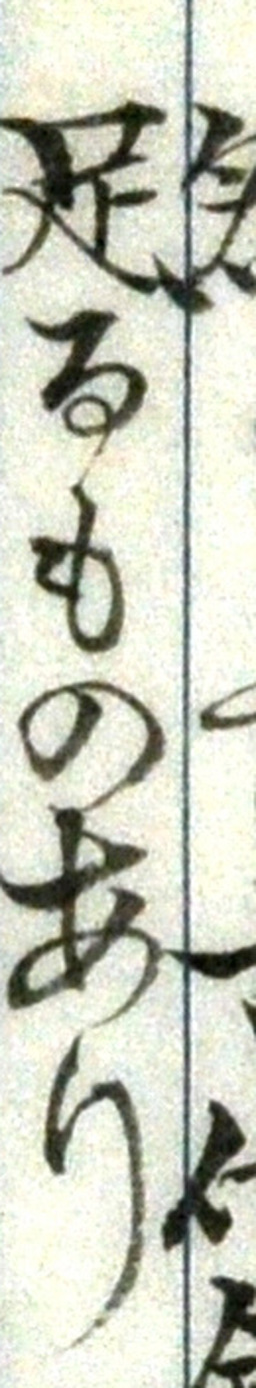足るものあり
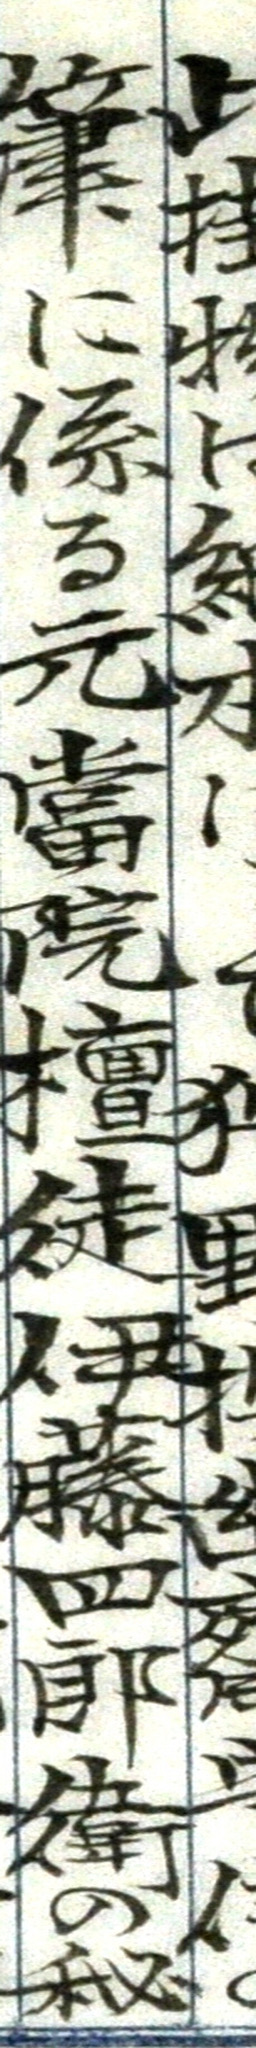筆に係る元当院檀徒伊藤四郎衛の秘
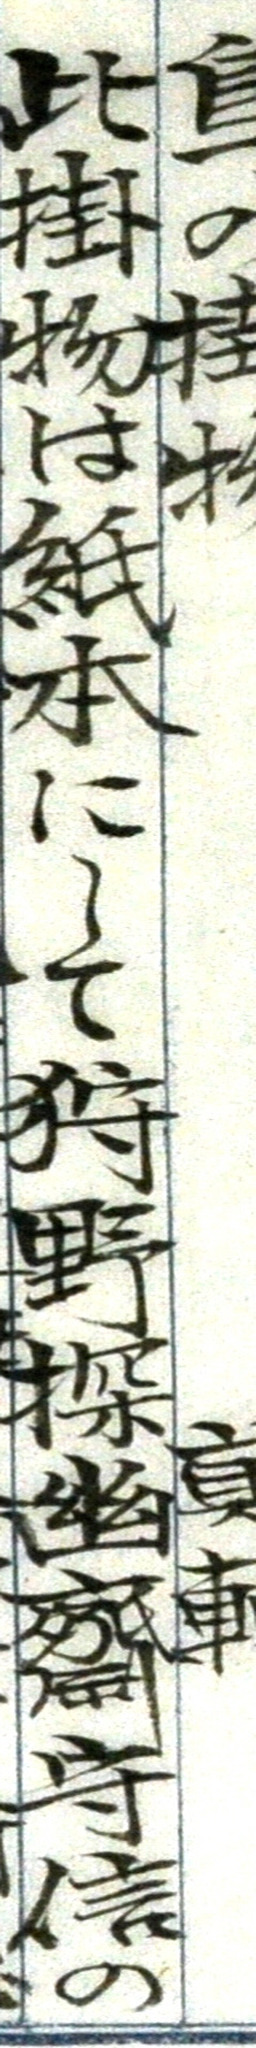此掛物は紙本にして狩野幽齋守信の
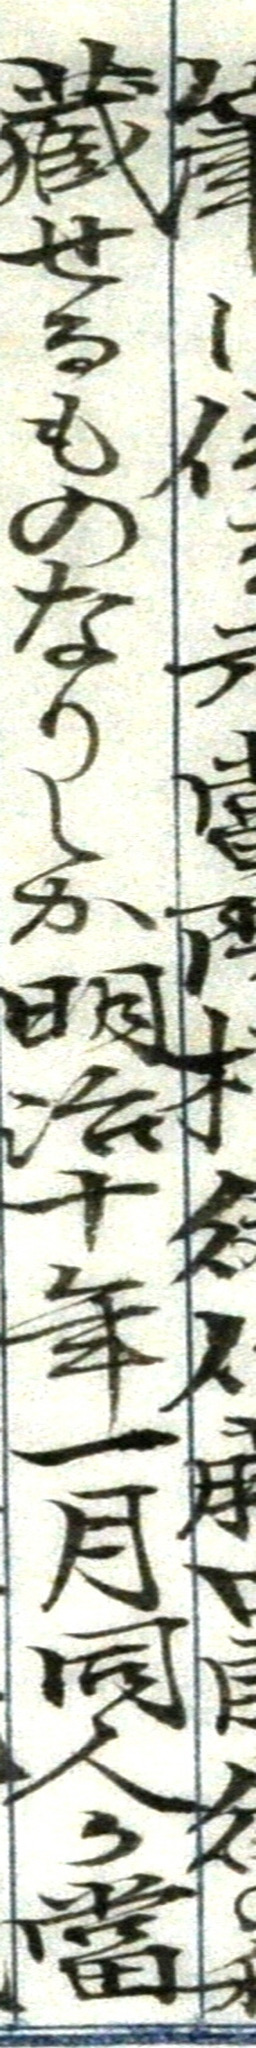蔵せるものなりしか明治十年一月同人か当
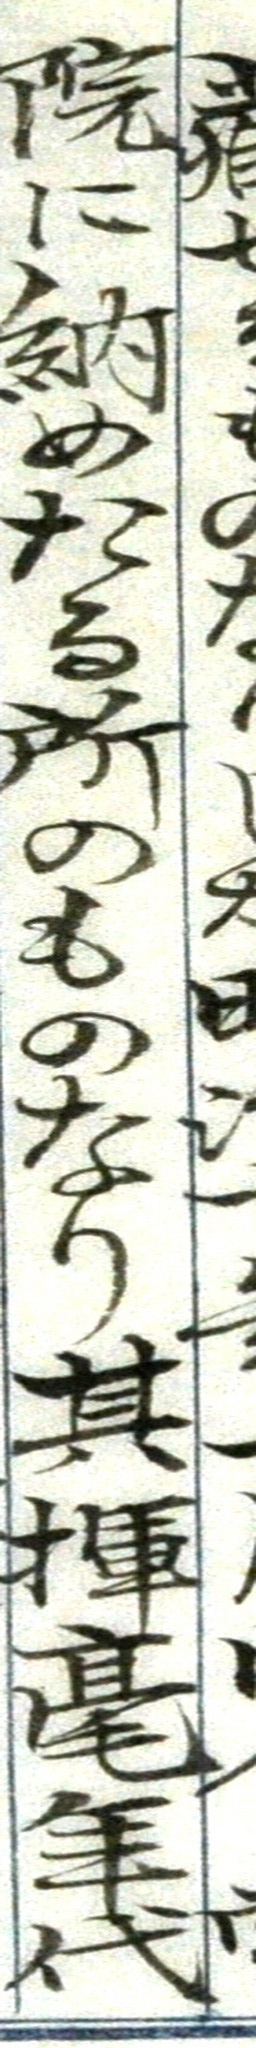院に納めたる所のものなり其揮毫年代
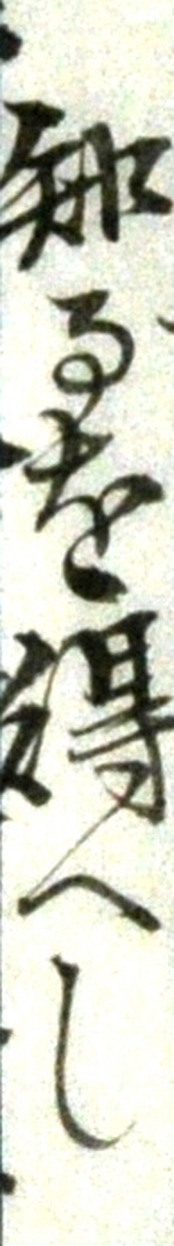知るを得へし
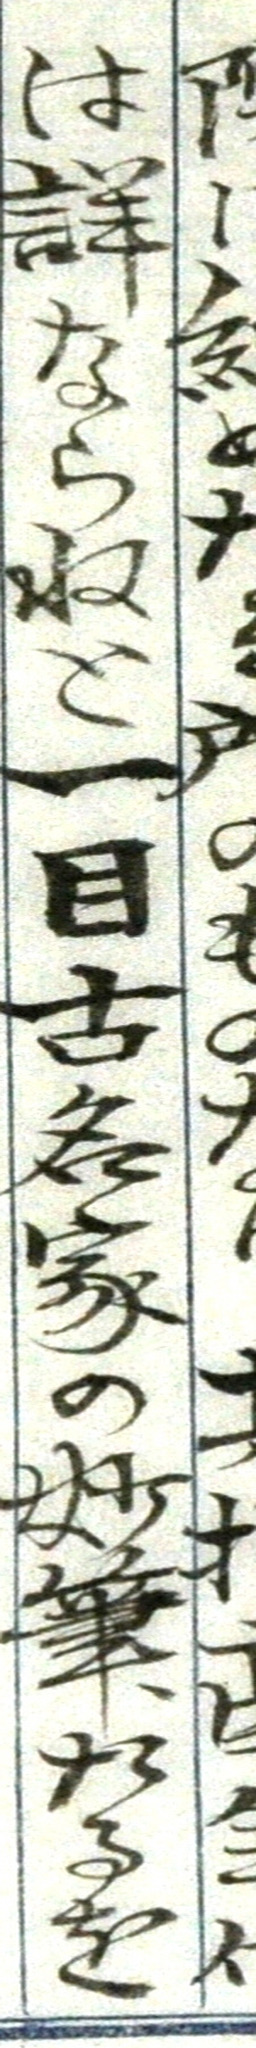は詳ならねと一目古名家の妙筆たるを
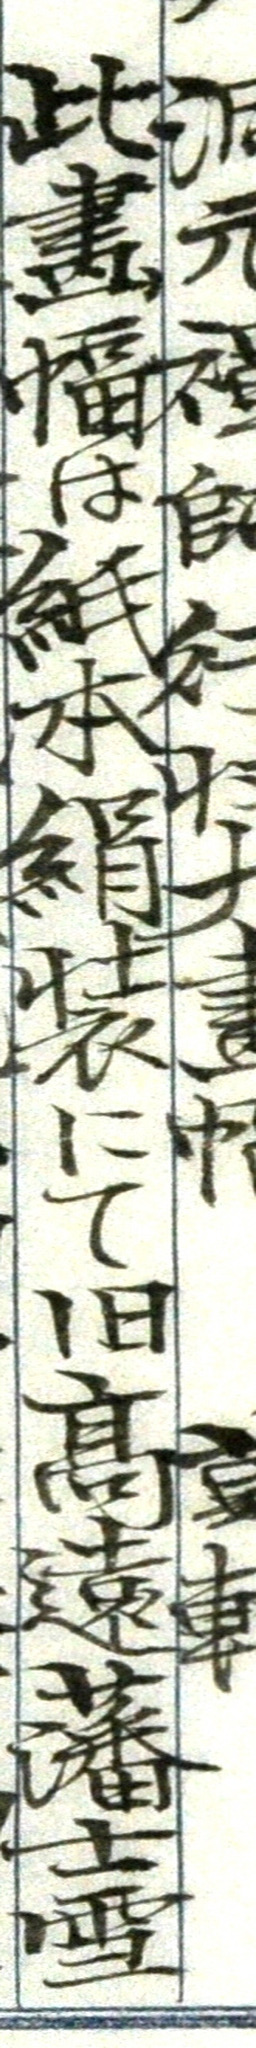此画幅は紙本絹装にて旧高遠藩士雪
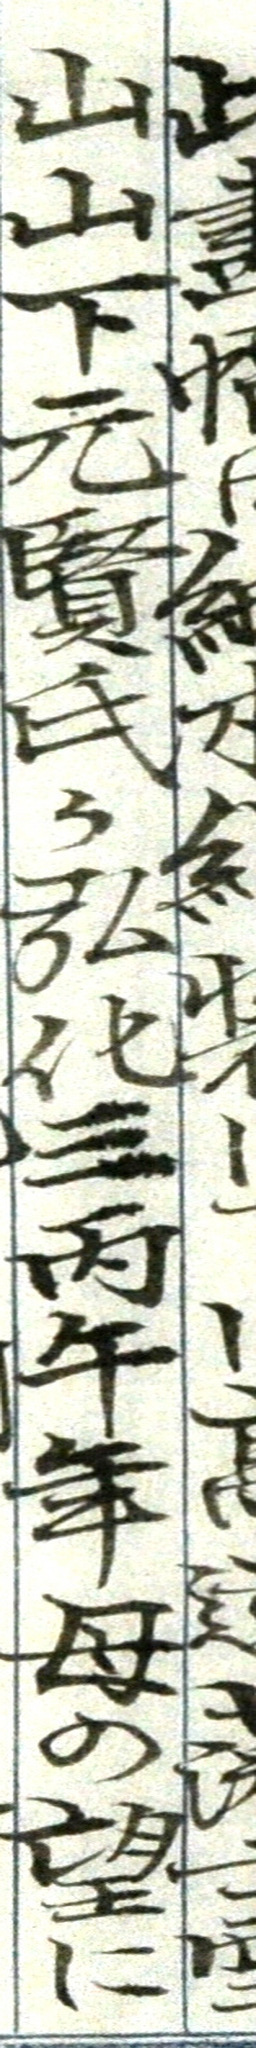山山下元賢氏か弘化三丙午年母の望に
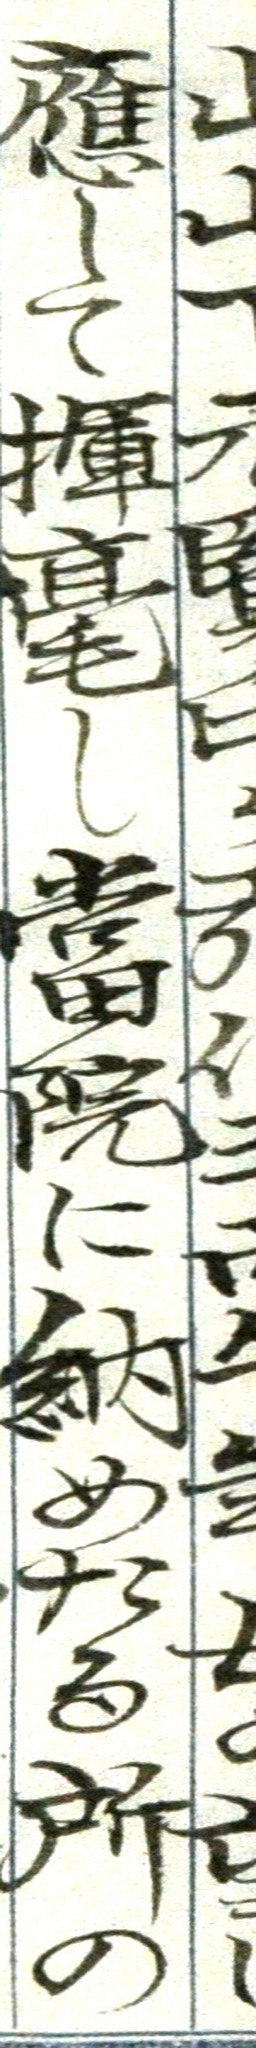応して揮毫し当院に納めたる所の
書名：桂泉院・樹林寺・東光寺縁起書、蓮華寺由来書、付夕顔観音記
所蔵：伊那市立高遠町図書館・合同会社AMANE
